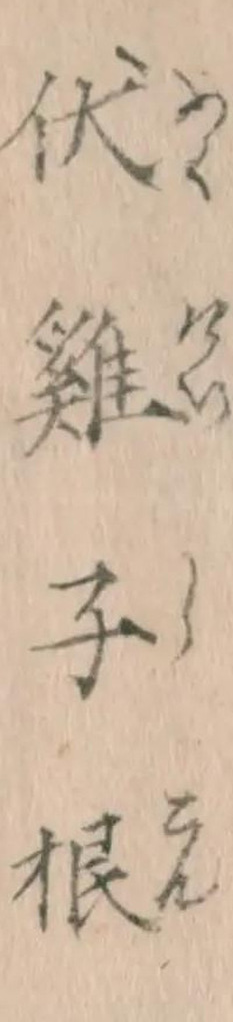伏鶏子根
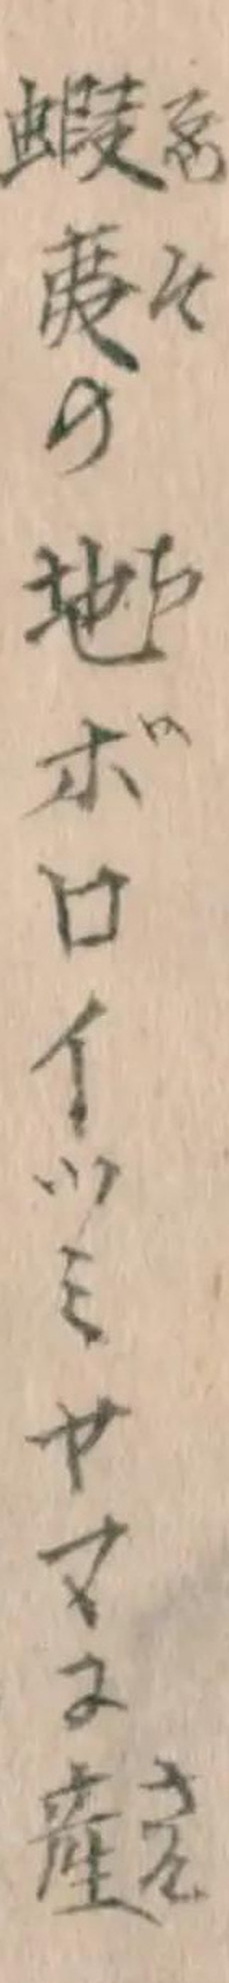蝦夷の地ボロイツミヤマに産
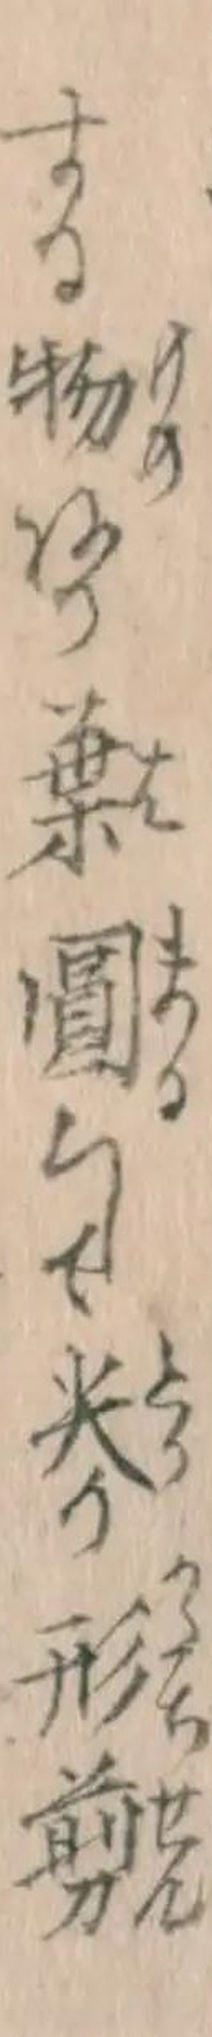する物あり葉円くして尖り形剪
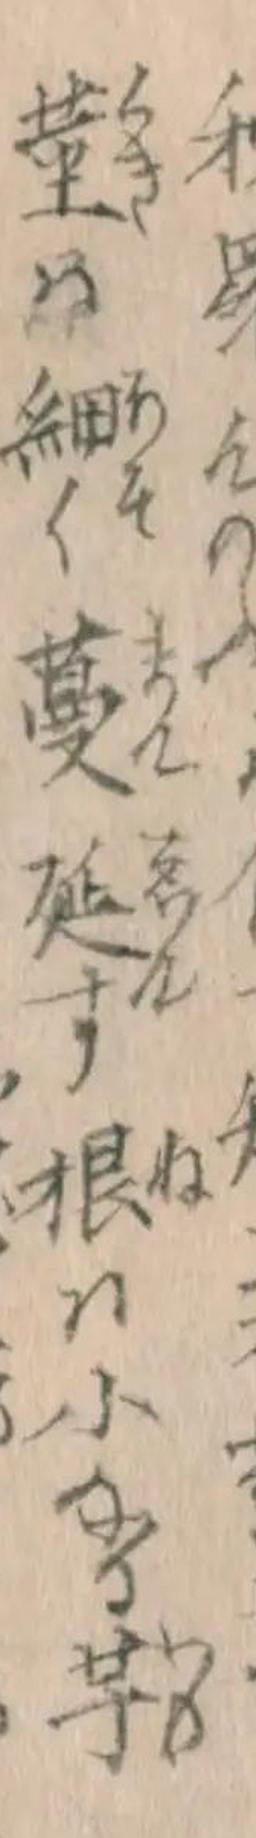茎は細く蔓延す根は小なる芋
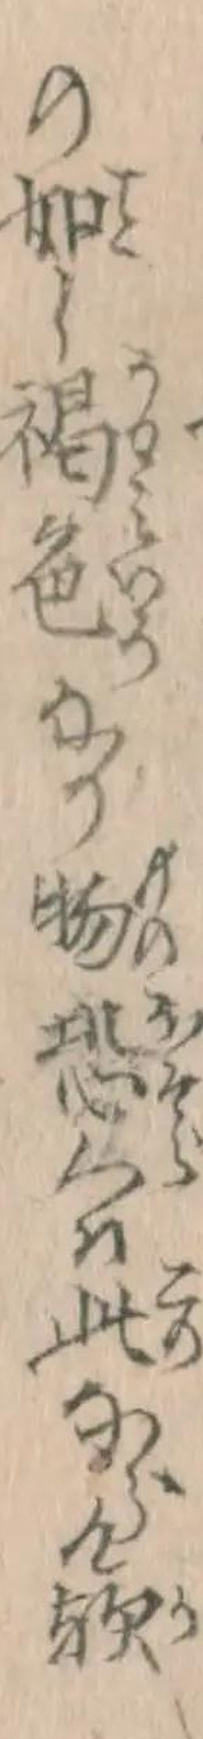の如し褐色なり物恐くは此ならん歟

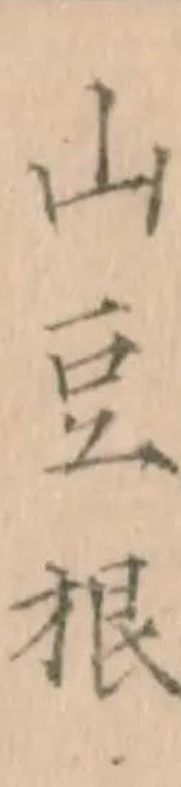山豆根
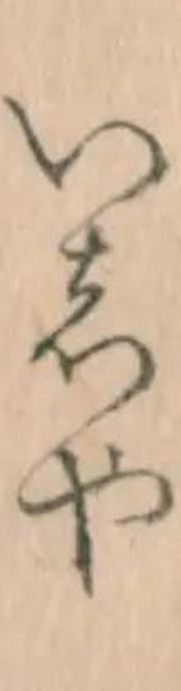いしや
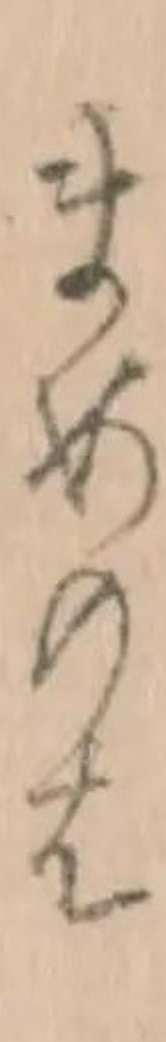まめのは
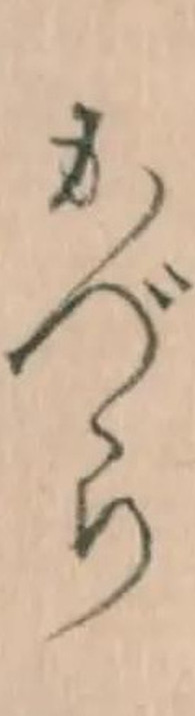かづら
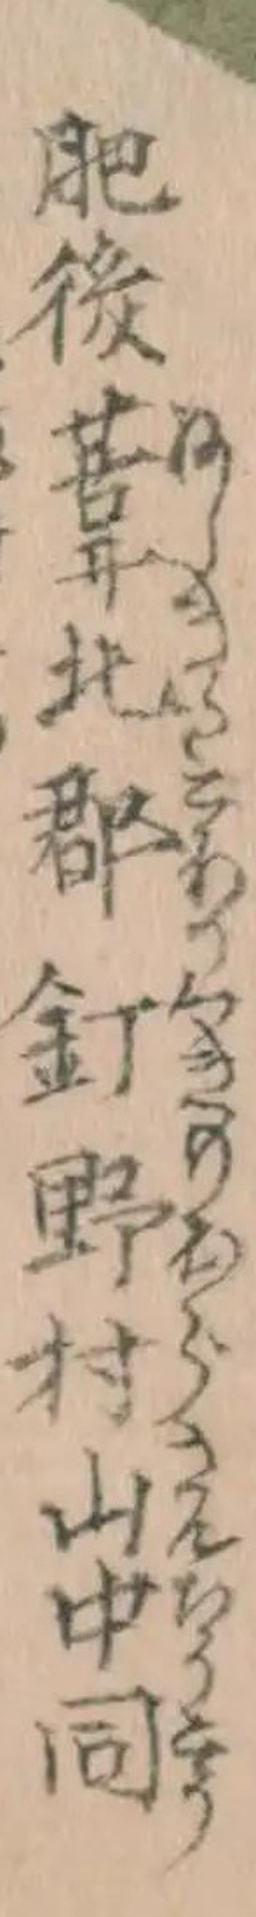肥後葦北郡釘野村山中同
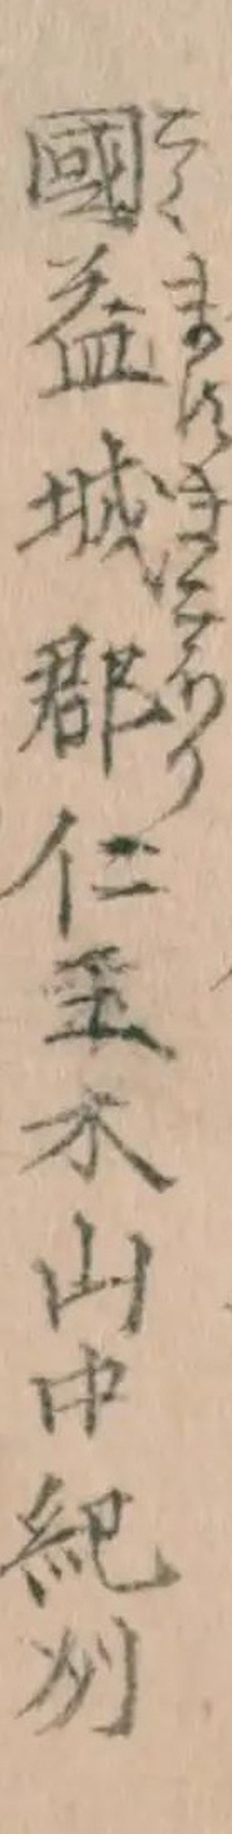国益城郡仁王木山中紀州
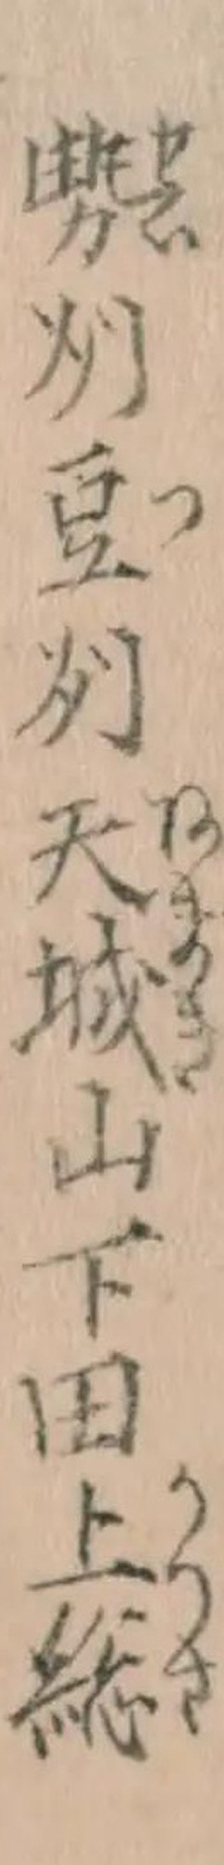勢州豆州天城山下田上総
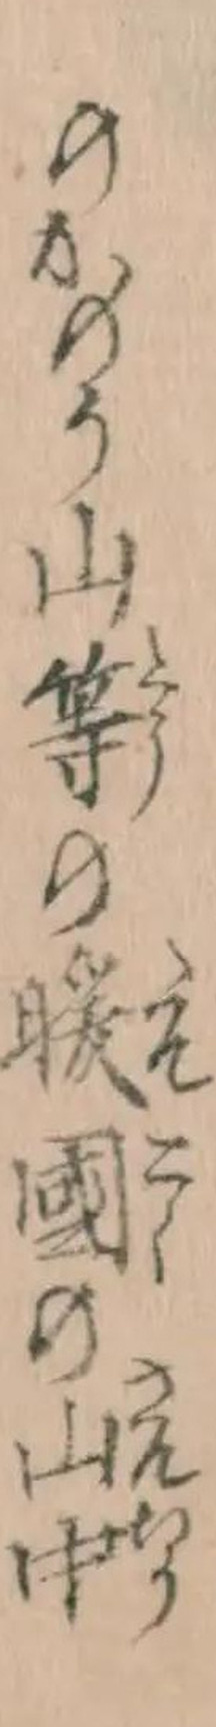のかのう山等の暖国の山中
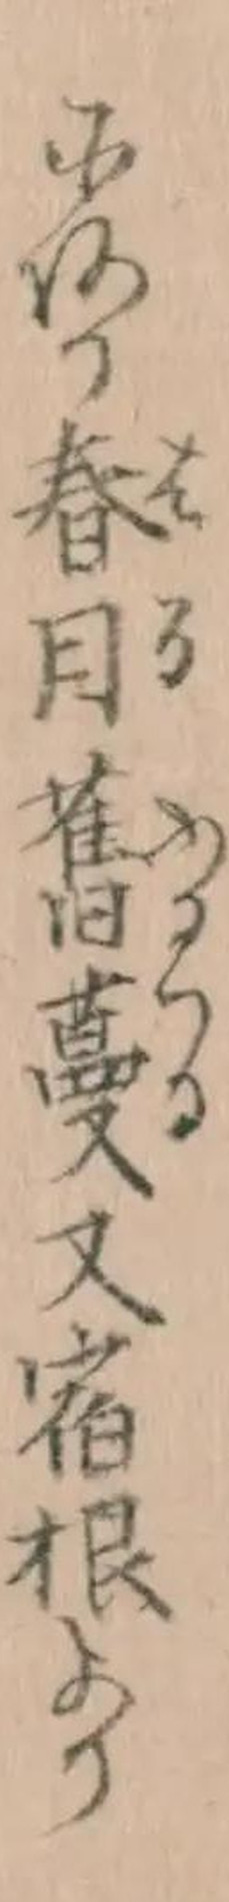にあり春月旧蔓又宿根より
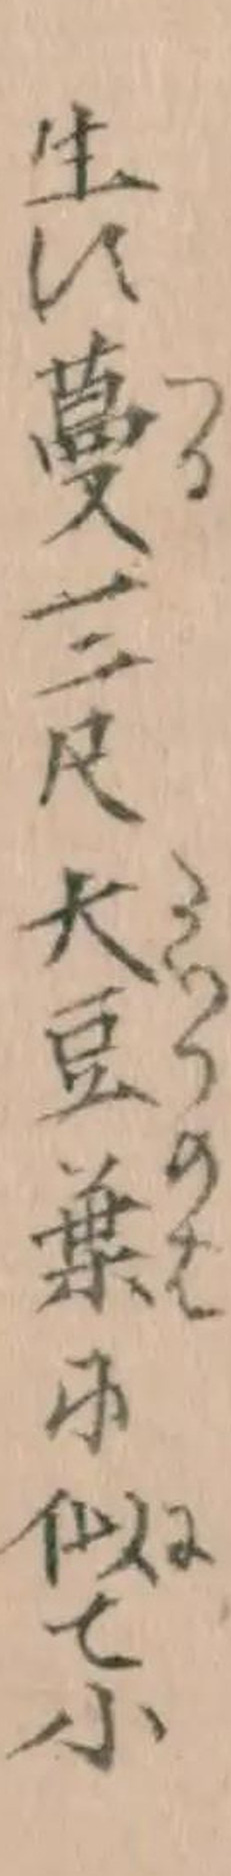生す蔓一二尺大豆葉に似て小
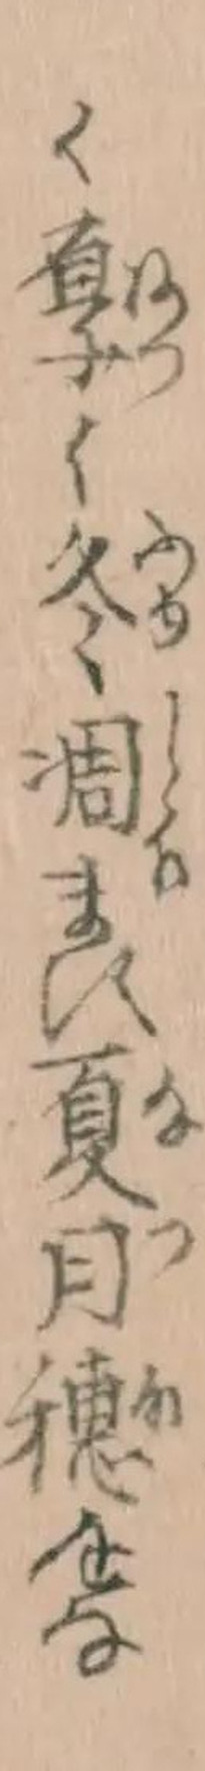く厚く冬凋ます夏月穂をな
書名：本草図譜. 巻28-30
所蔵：国立国会図書館 National Diet Library, JAPAN
